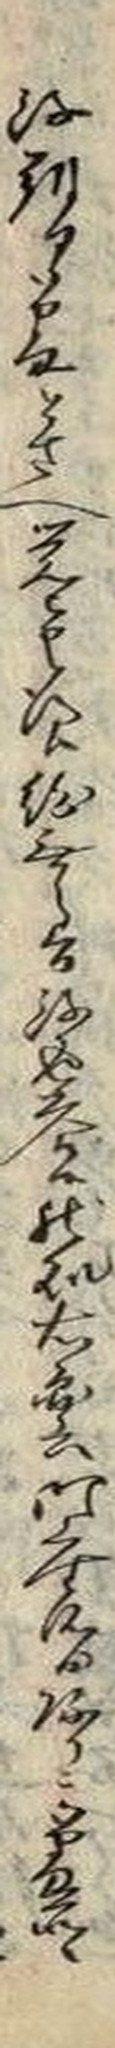致朔日御番をさへ覚被申候得は紛無候旨致返答候然処右圓六御座所ゟ帰りに御番所へ
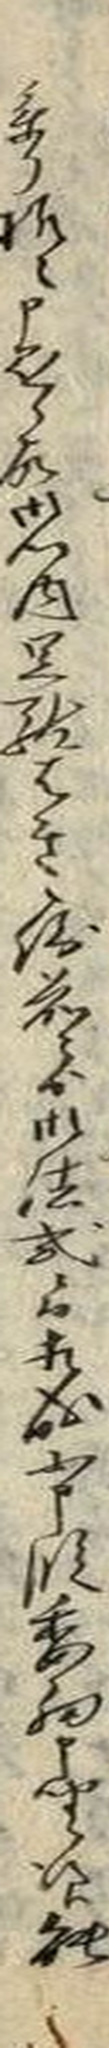参り様ニ申懸候故御門内足駄はき之儀前々ゟ御法式に而相成不申段委細申聞候得は能
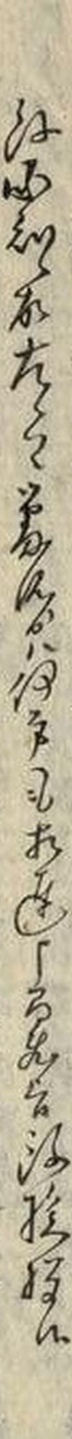致承知候故左候はゝ御番所ゟは何方も相達申間敷旨致挨拶候
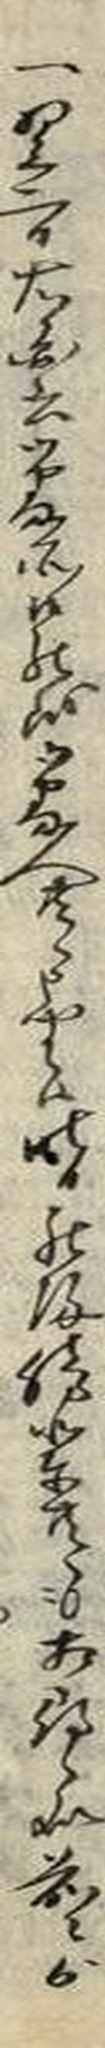一翌二日右円六御番所江罷越御番人共へ申聞候は昨日罷帰傍輩共へも相尋候処前々ゟ
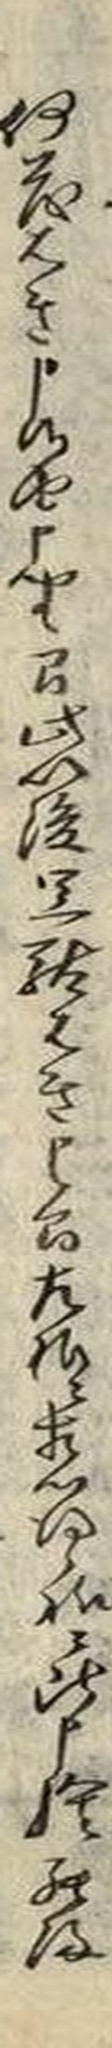何もはき申候由申聞候間此以後足駄はき申候間左様に相心得候様に断申捨罷帰
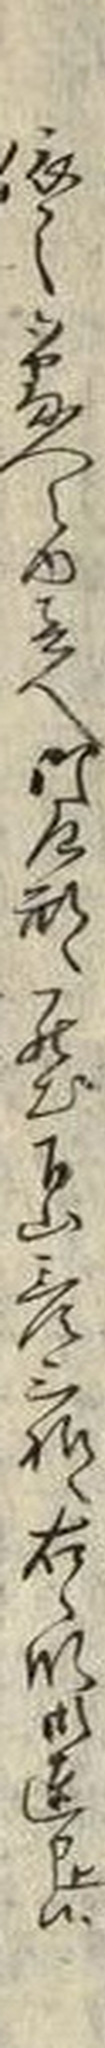依之御番人之内壱人御屋形へ罷出下山彦三様へ右之段御達申上候
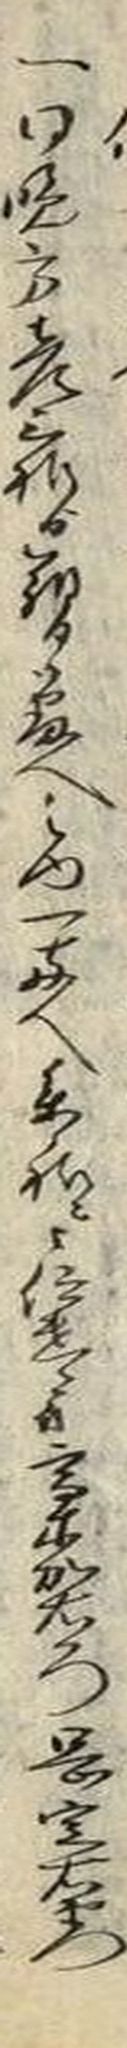一同晩方彦三様ゟ朔日御番人之内一両人参候様に被仰遣候に付高木加右衛門岡定右衛門
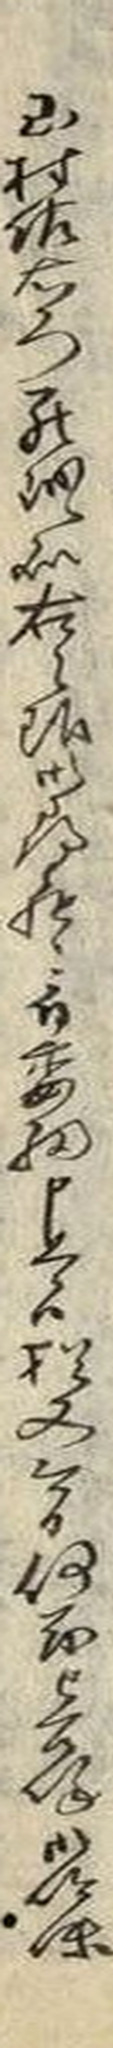玉村佐右衛門罷越候処右之趣御尋被遊候に付委細申上候猶又今日何も被召呼御吟味
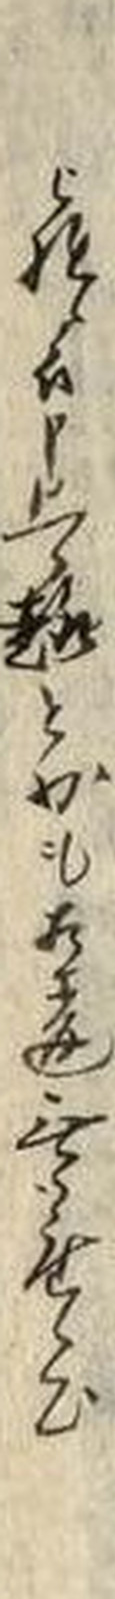被遊候付申上候趣と少も相違無御座候以上
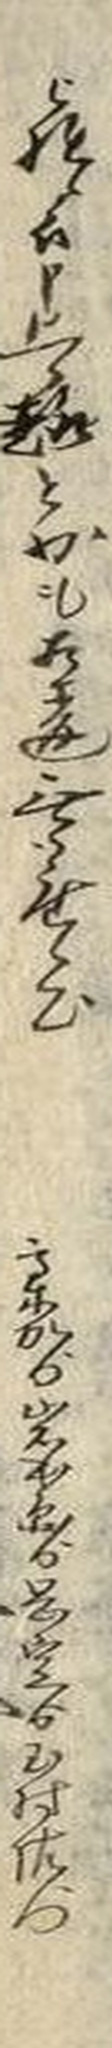被遊候付申上候趣と少も相違無御座候以上
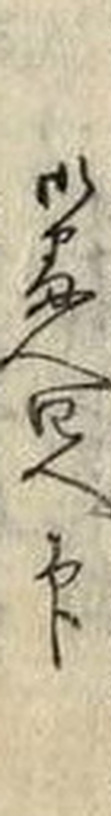御番人四人印
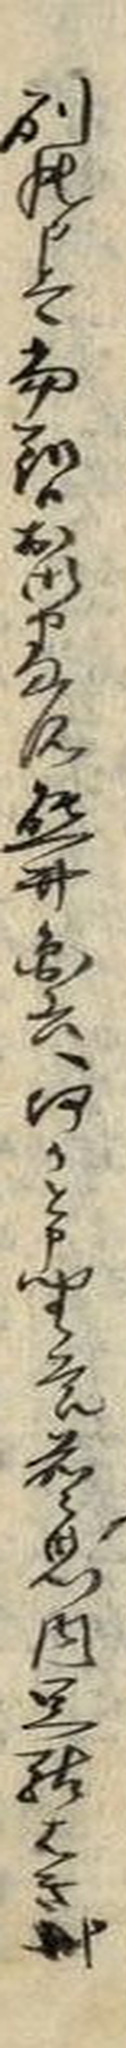別紙仕上候当朔日於御番所熊井円六へ何かと申聞候節前々御門内足駄はき申
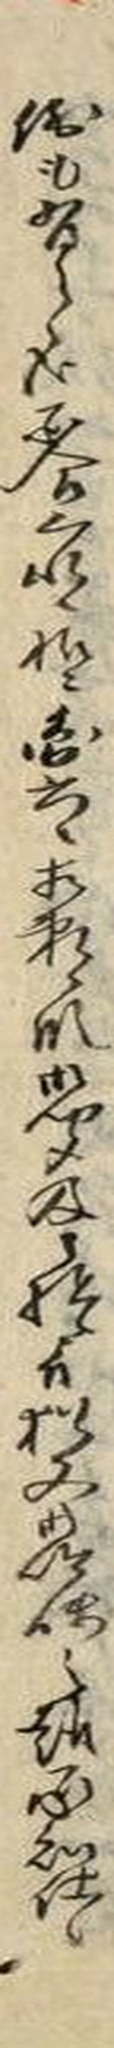儀も有之候哉承合くれ候様に円六へ相頼候段御聞及被遊候に付猶又御吟味之趣承知仕候

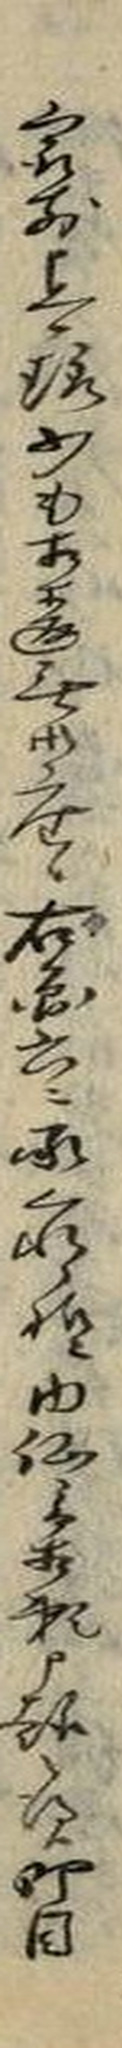最前申上候趣少も相違無御座候右円六に承くれ候様に内証に而相頼申趣候得は御目
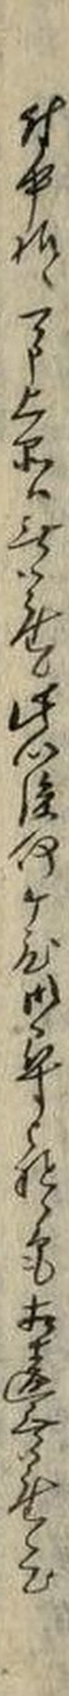付中様へ可申上品は無御座候此以後何ヶ度御尋被遊候而も相違無御座候以上
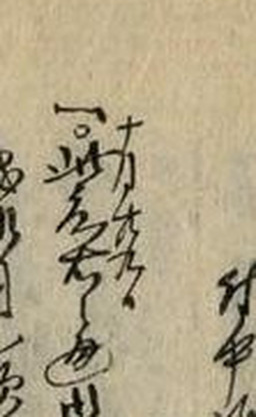十月廿九日
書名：御門御櫓之部
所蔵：福井県文書館 Fukui Prefectural Archives
